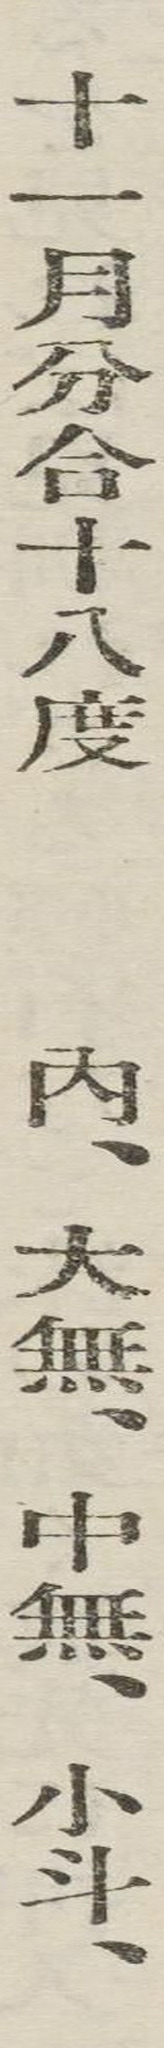十一月分合十八度内、大無、中無、小斗、
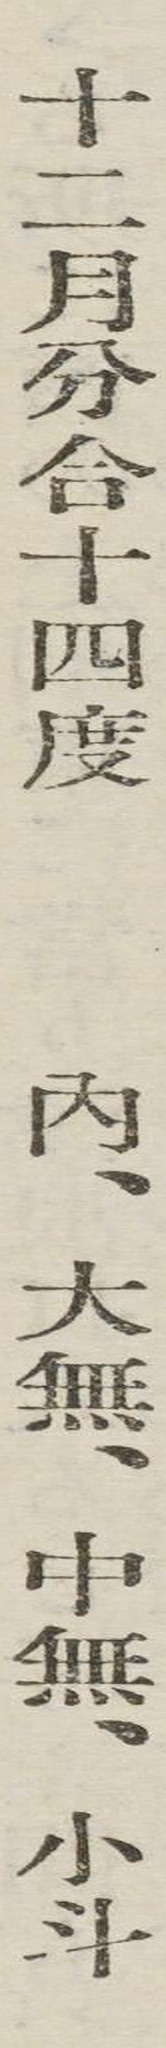十二月分合十四度内、大無、中無、小斗
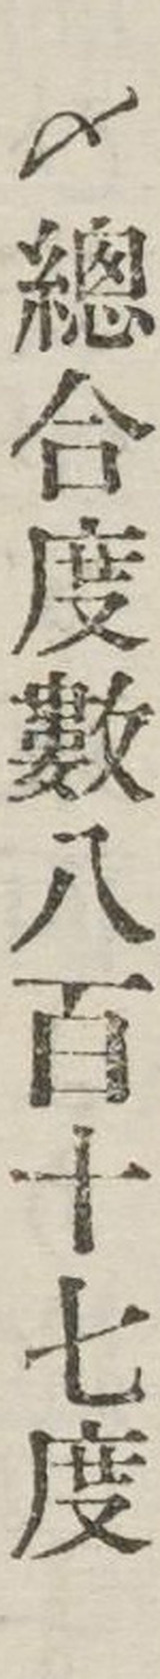〆総合度数八百十七度
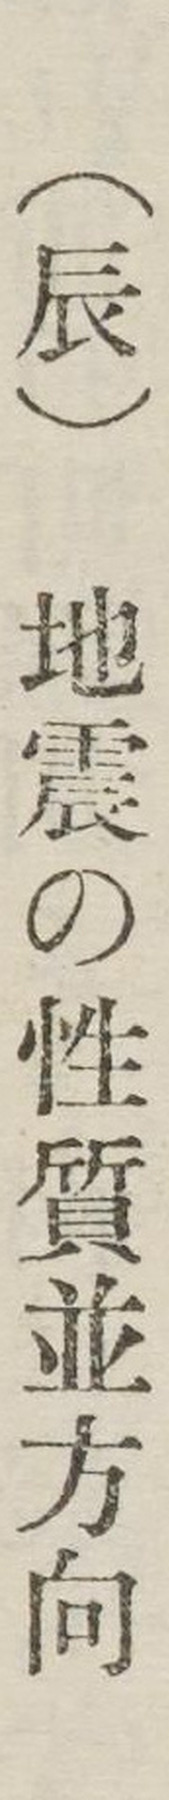地震の性質並方向
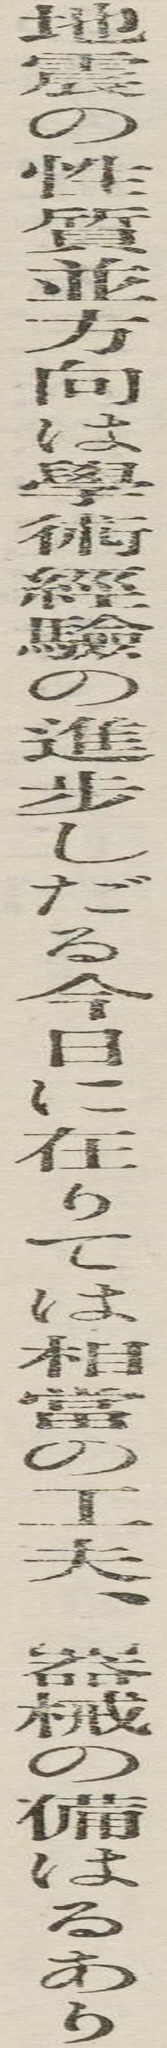地震の性質並方向は学術経験の進歩しだる今日に在りては相当の工夫、器械の備はるあり
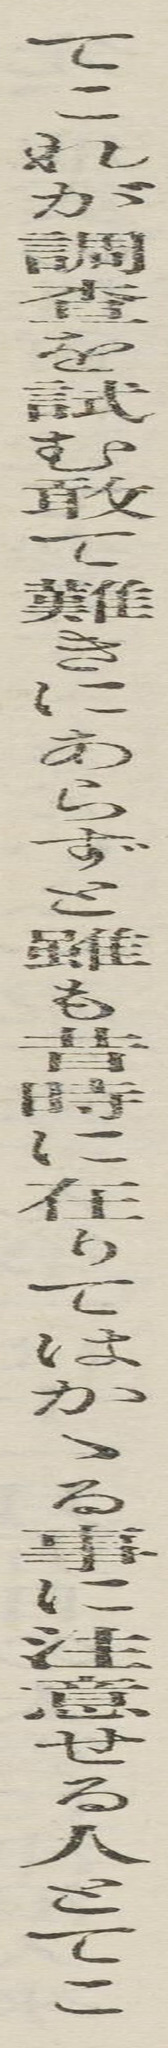てこれが調査を試む敢て難きにあらずと雖も昔時に在りてはかゝる事に注意せる人とてこ
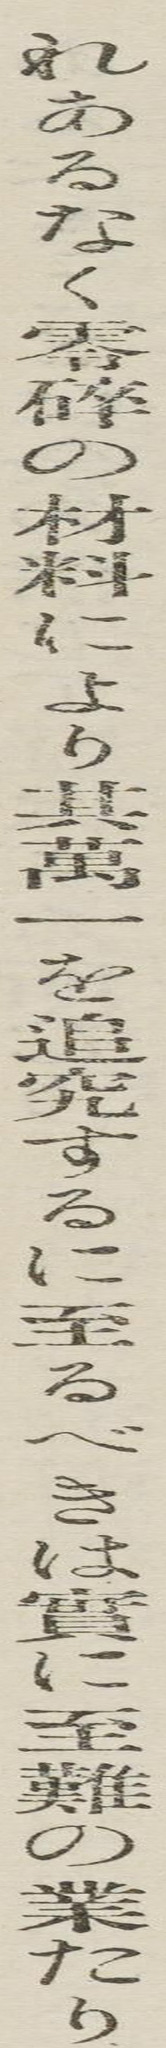れあるなく零砕の材料により其万一を追究するに至るべきは実に至難の業たり
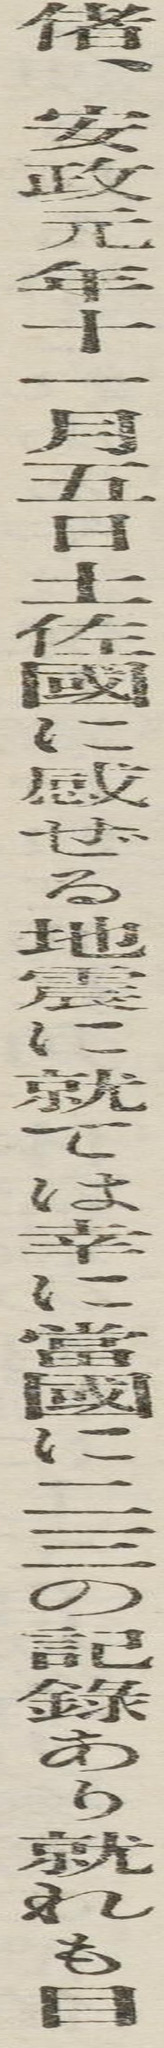偖、安政元年十一月五日土佐国に感ぜる地震に就ては幸に当国に二三の記録あり就れも目
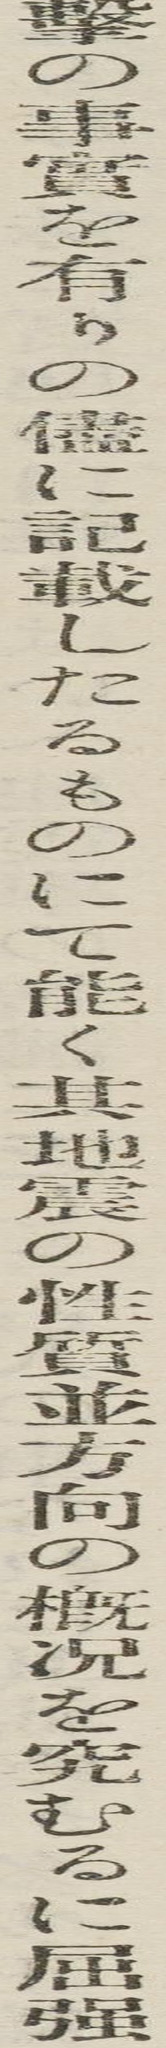撃の事実を有りの侭に記載したるものにて能く其地震の性質並方向の概况を究むるに屈強
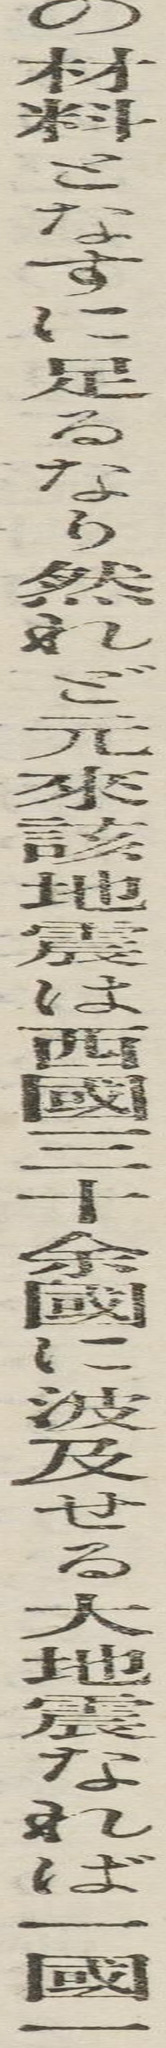の材料となすに足るなり然れど元来該地震は西国三十余国に波及せる大地震なれば一国一

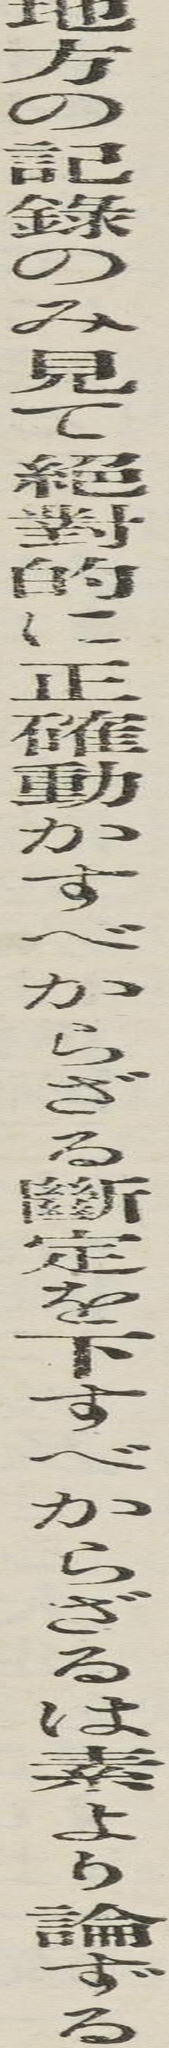地方の記録のみ見て絶対的に正確動かすべからざる断定を下すべからざるは素より論ずる
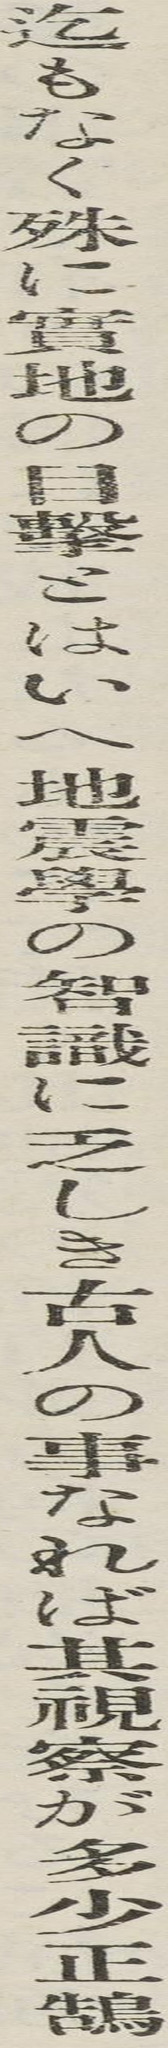迄もなく殊に実地の目撃とはいへ地震学の智識に乏しき古人の事なれば其視察が多少正鵠
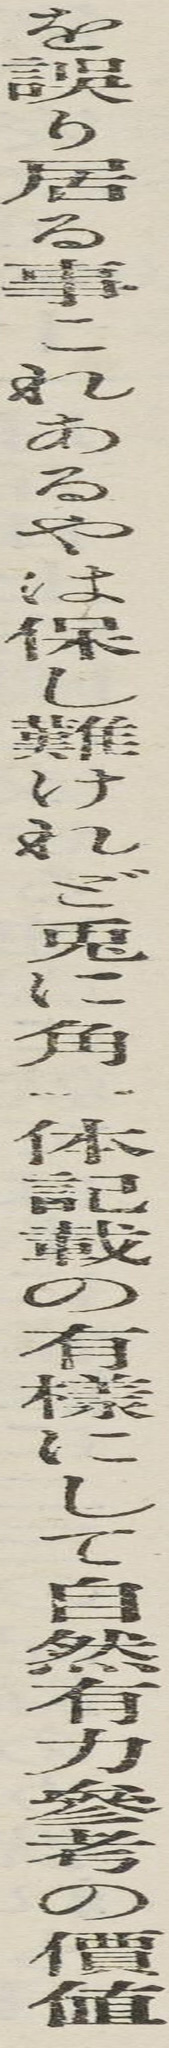を誤り居る事これあるやは保し難けれど兎に角一体記載の有様にして自然有力参考の価値
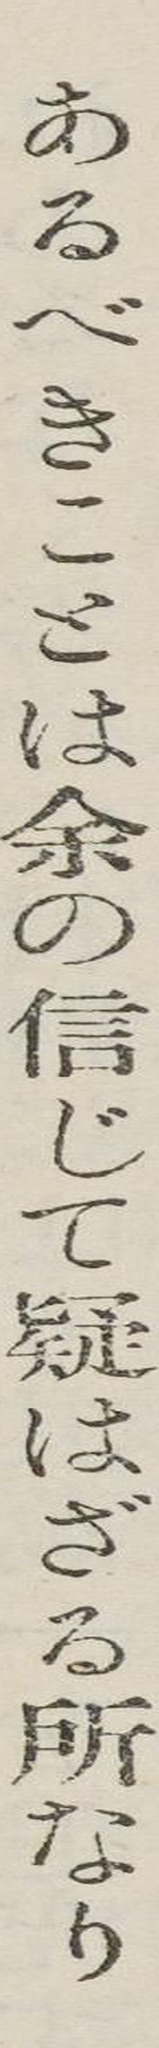あるべきことは余の信じて疑はざる所なり
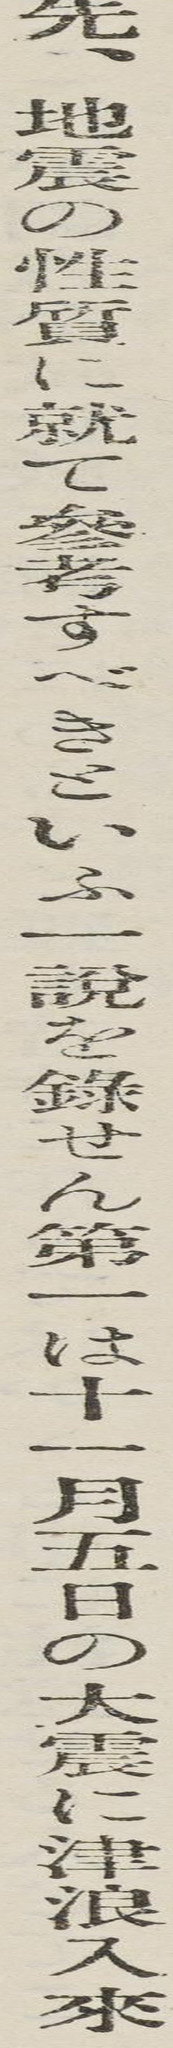先、地震の性質に就て参考すべきといふ一説を録せん第一は十一月五日の大震に津浪入来
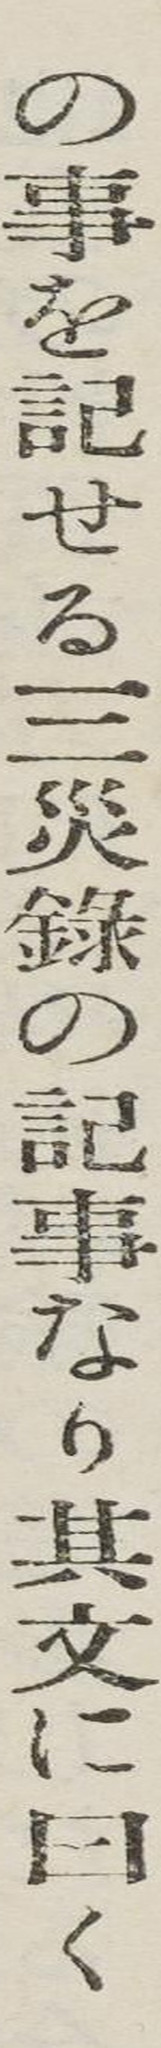の事を記せる三災録の記事なり其文に曰く
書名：土佐古今ノ地震
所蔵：東京大学地震研究所図書室 Earthquake Research Institute Library, The University of Tokyo, JAPAN
